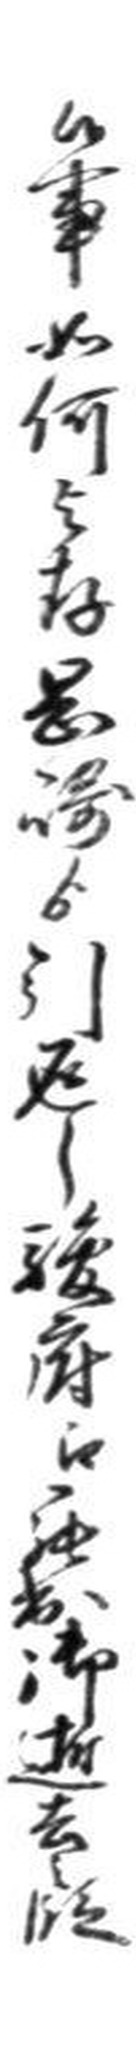候事如何と存岡崎ゟ引返し駿府江罷出御逝去之段
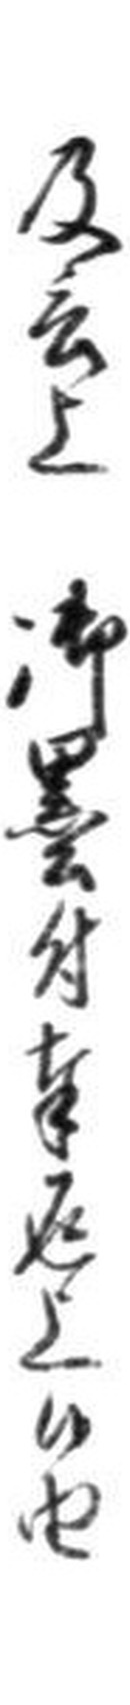及言上御墨付奉返上候由
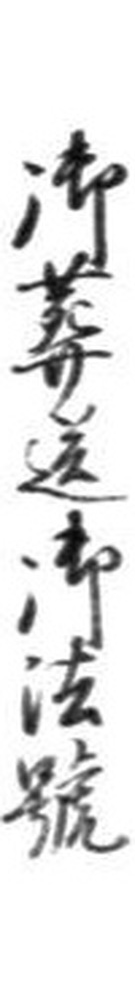御葬送御法号
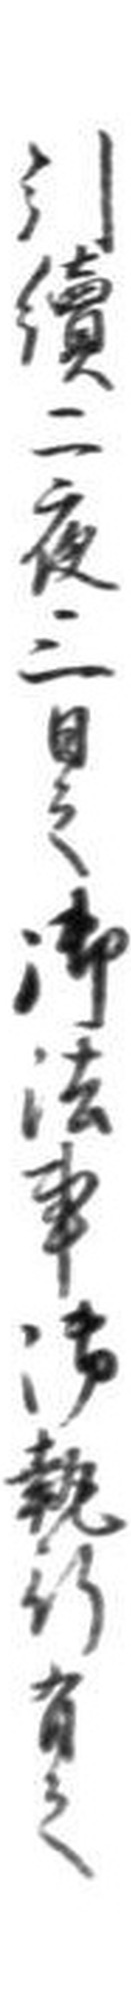引続二夜三日之御法事御執行有之
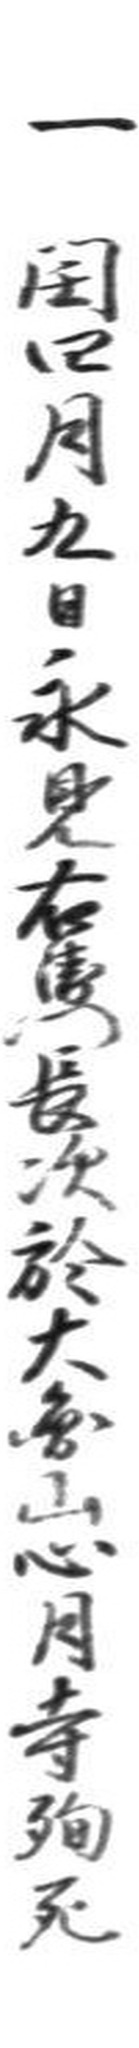一閏四月九日永見右衛門長次於大円山心月寺殉死
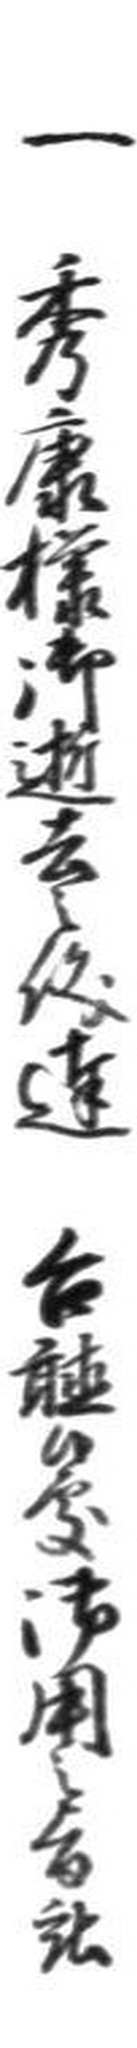一秀康様御逝去之儀達台聴候処御用之旨被

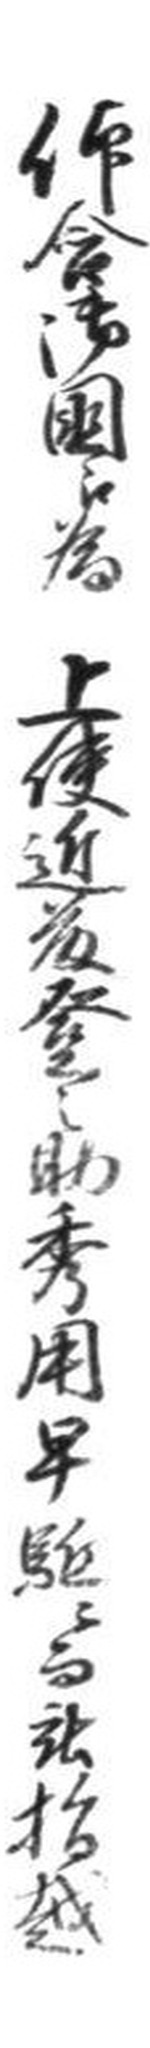仰含御国江為上使近藤登之助秀用早駈ニ而被指越
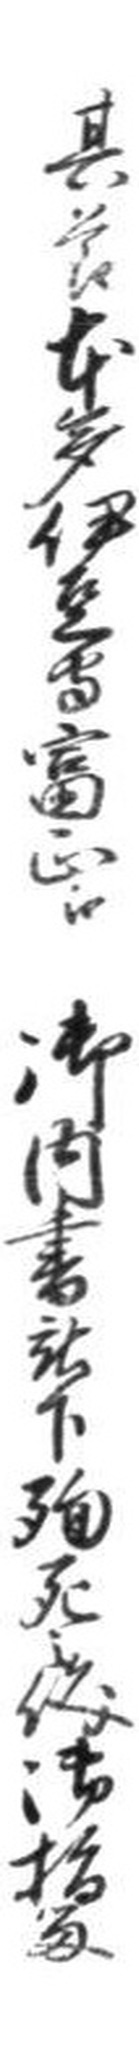其節本多伊豆守富正江御内書被下殉死之儀御指留
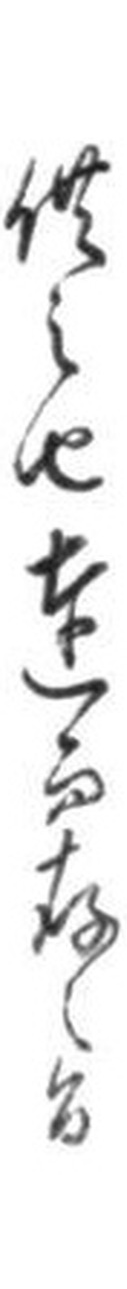供之由達而存之旨
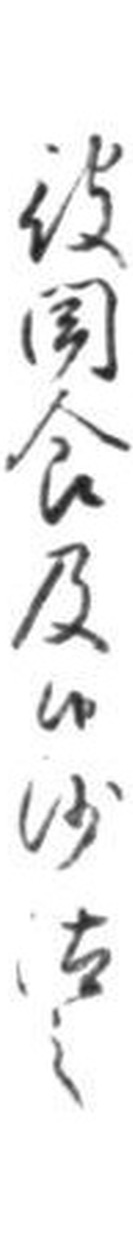被聞食及候沙汰之
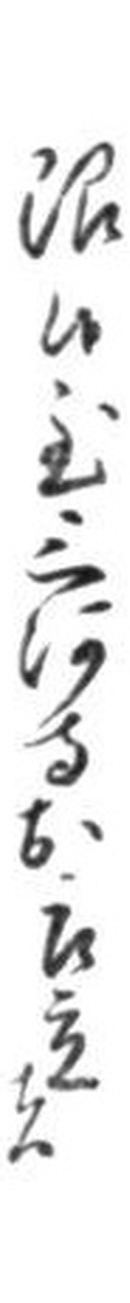限候至三河守於取立者
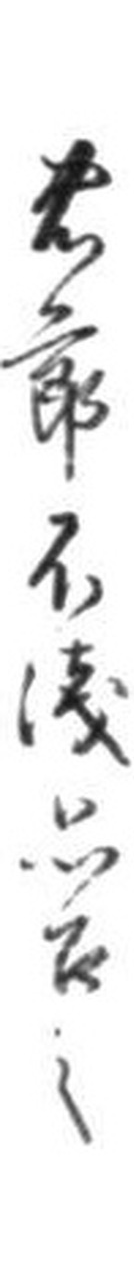忠節不浅思召之
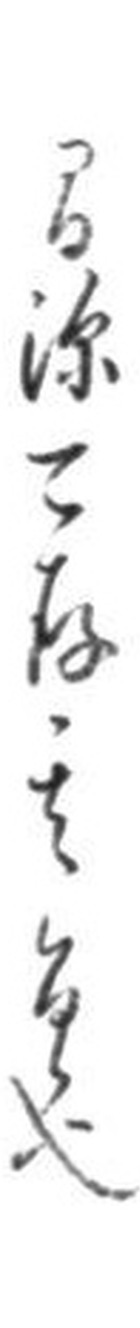間深可存其旨候也
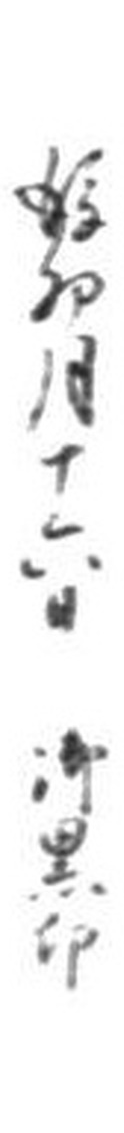後卯月十六日御黒印
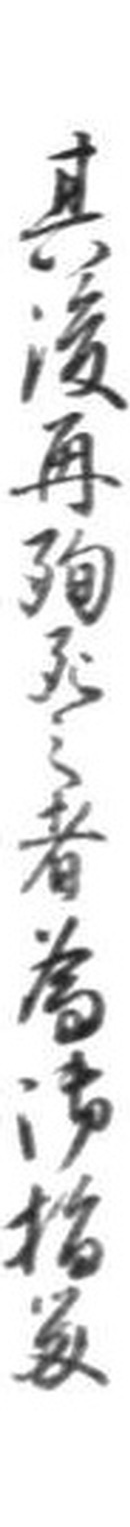其後再殉死之者為御指留
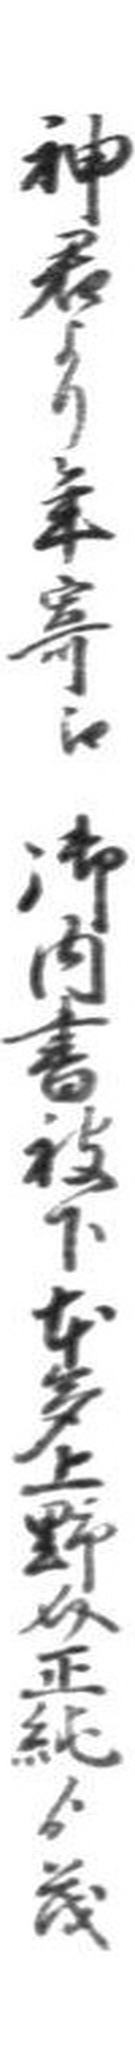神君より年寄江御内書被下本多上野介正純ゟも
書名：家譜 一 秀康公 従天正二年到慶長十二年
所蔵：福井県文書館 Fukui Prefectural Archives
